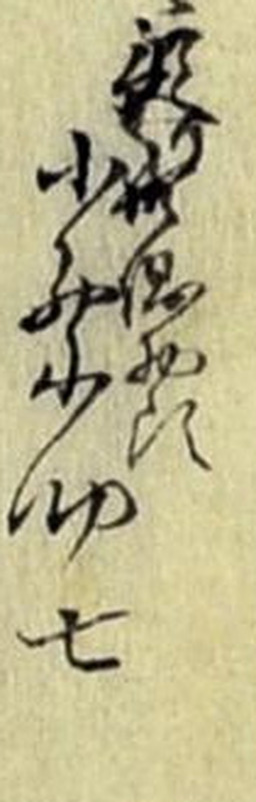小栗助七
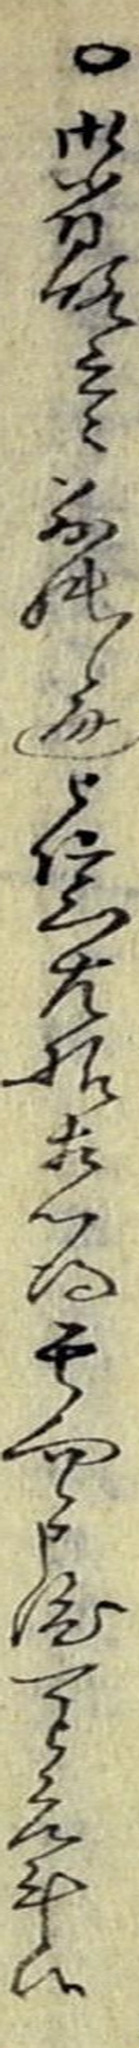○御省略云々別紙之通被仰出左様相心得其向へ申渡可被取斗候
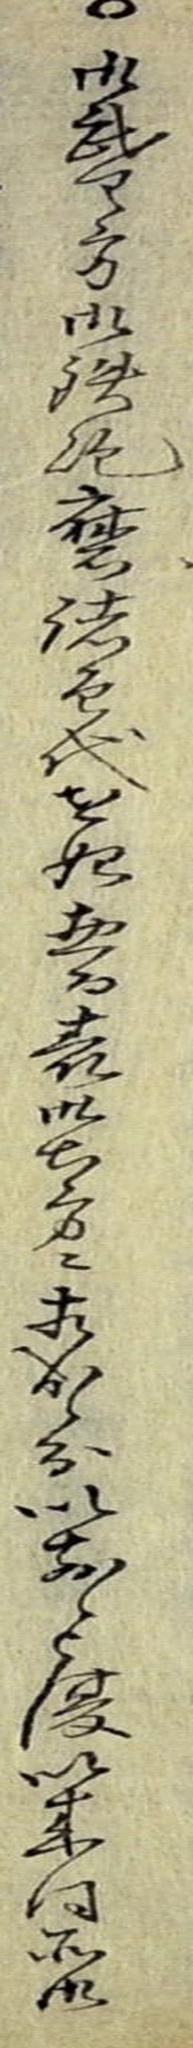○御武具方御鉄砲磨諸色代始惣而表御出方に相成候分以前へ被復以來同所御
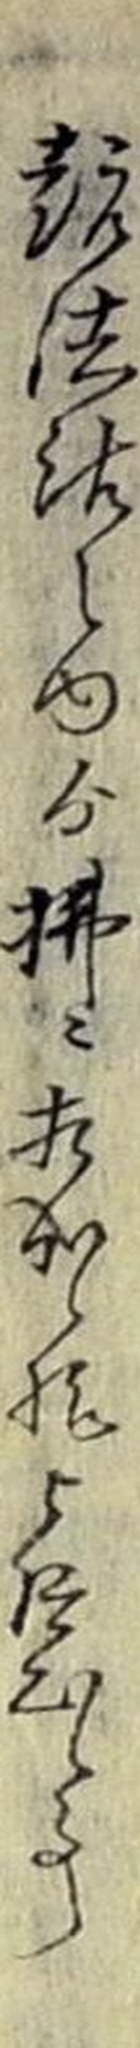趣法銀之内ゟ払に相成候様被仰出候事
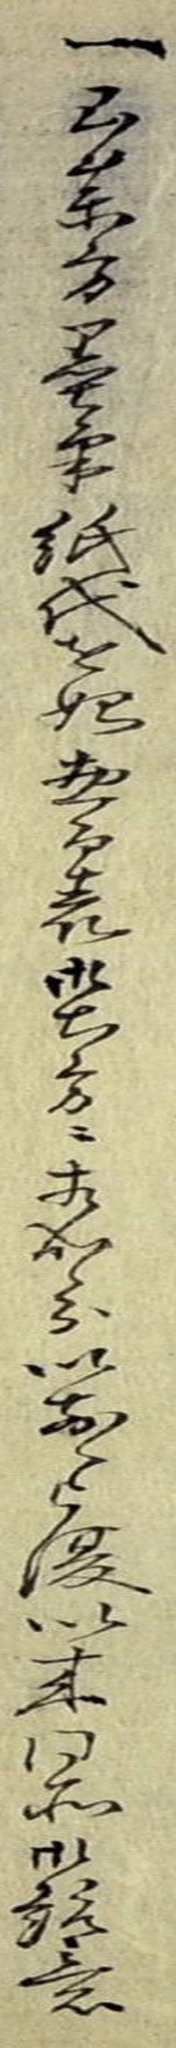一玉薬方墨筆紙代を始惣而表御出方に相成候分以前へ被復以來同所御趣意
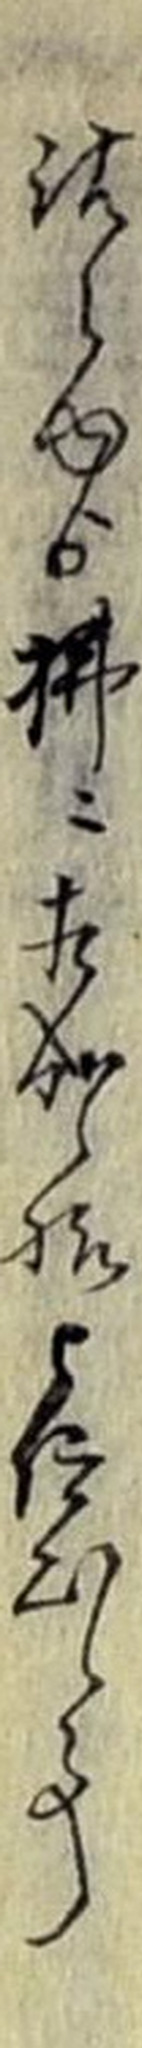銀之内ゟ払に相成候様被仰出候事
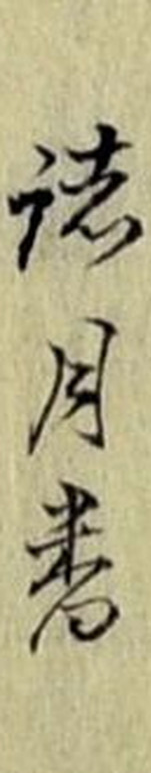諸月番
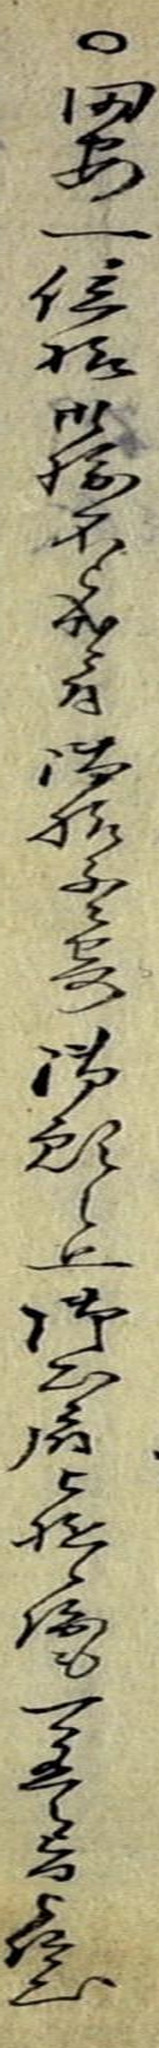○田安一位様御勝不被成候に付御様子に寄御願之上御出府被遊候儀も可有之旨被仰出
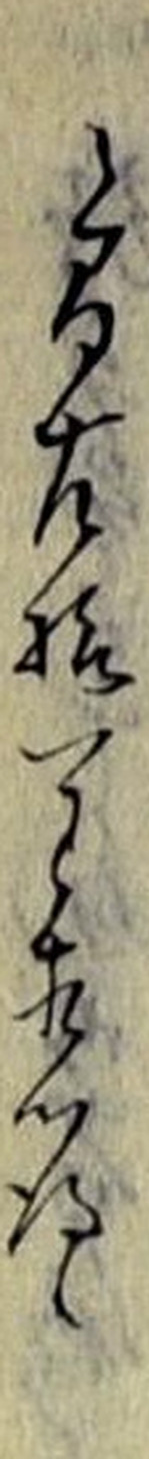候間左様可被相心得候
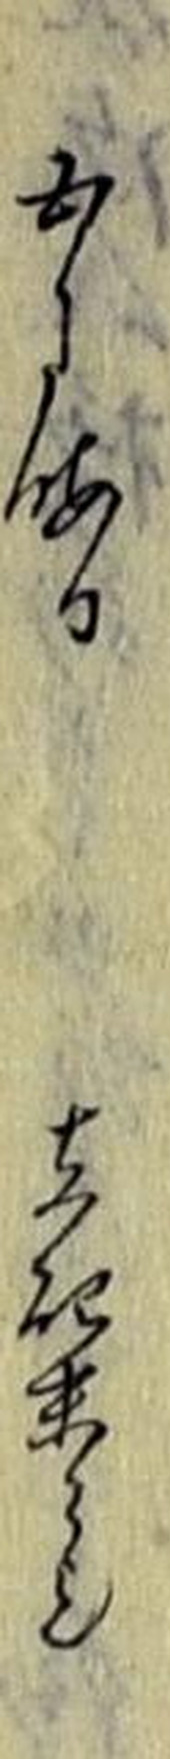五月晦日支配末々迄
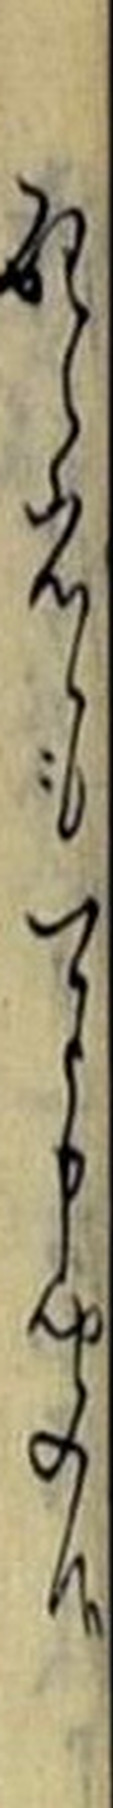配之者へも可被申聞候
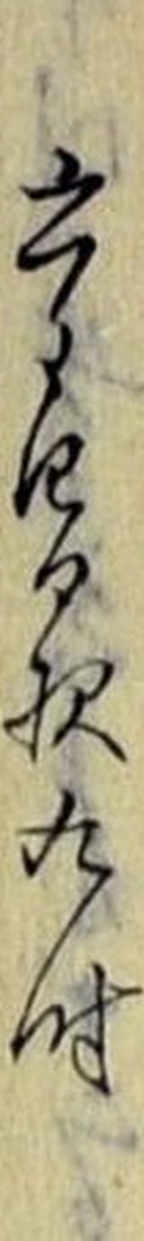六月四日夜九時
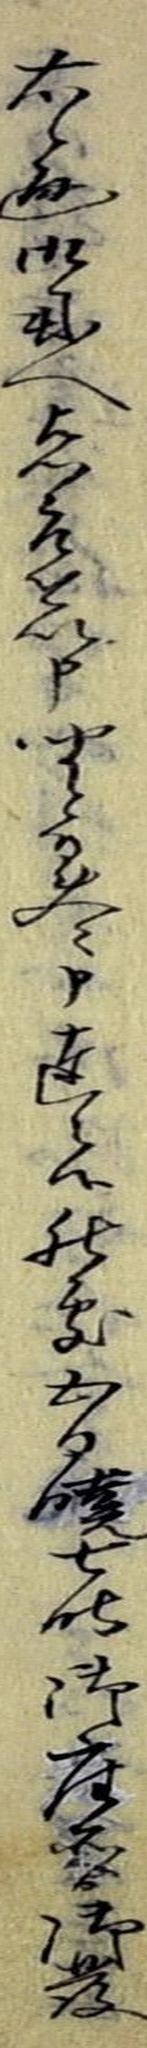右之通御用人点取を以申聞候に付夫々申達候然処五日暁七時御座所御発
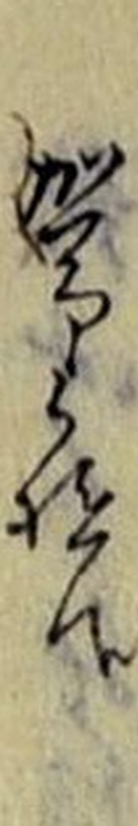駕被遊候
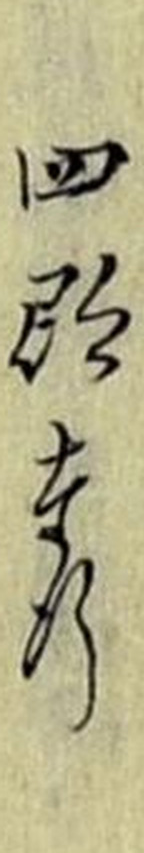四郡奉行
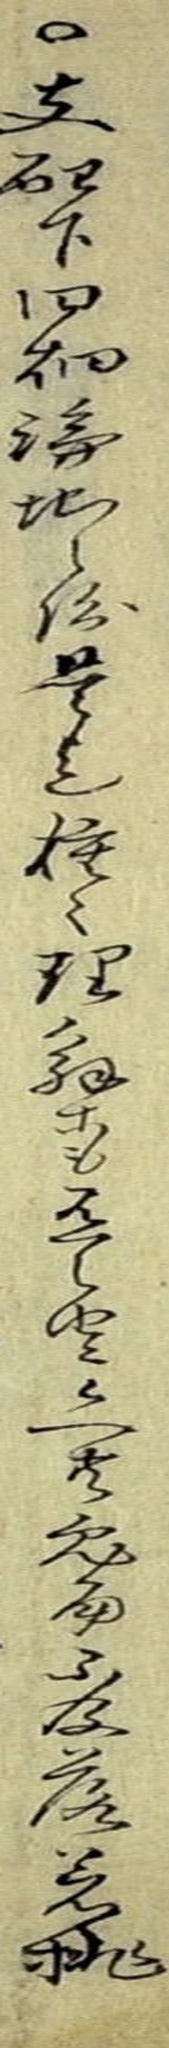○支配下田畑論地ノ儀是迄種々理解等も有之由に候へ共兎角不及落着排
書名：命令之部 六
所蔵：福井県文書館 Fukui Prefectural Archives
